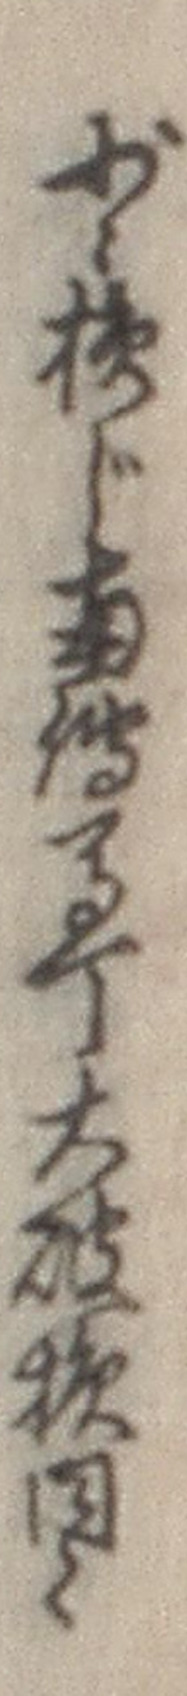少〻損じ南傳馬丁大破損同く
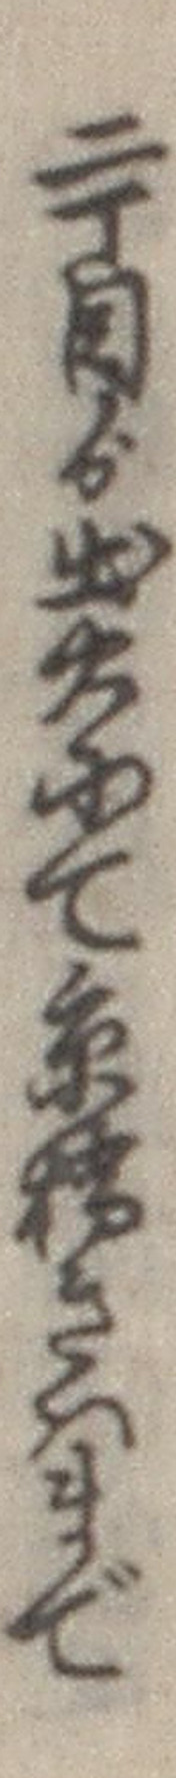二丁目ゟ出火にて京橋きはまで
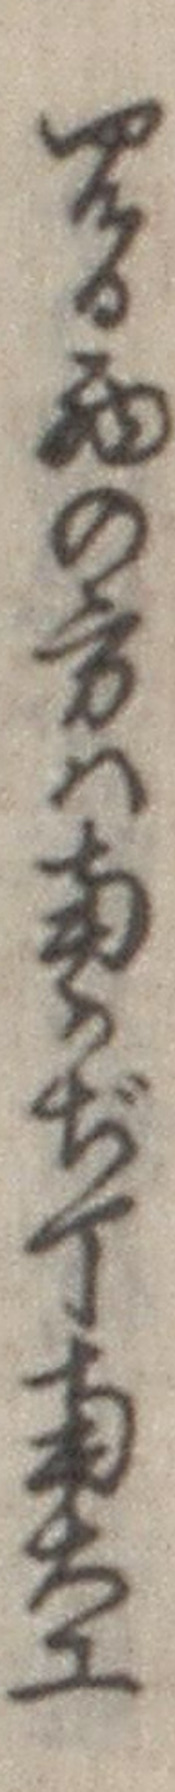やける西の方は南かぢ丁南大工
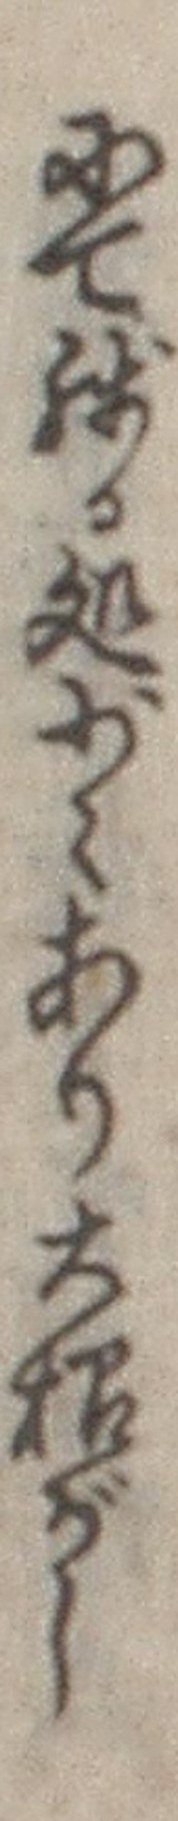にて残る処少〻あり大根がし
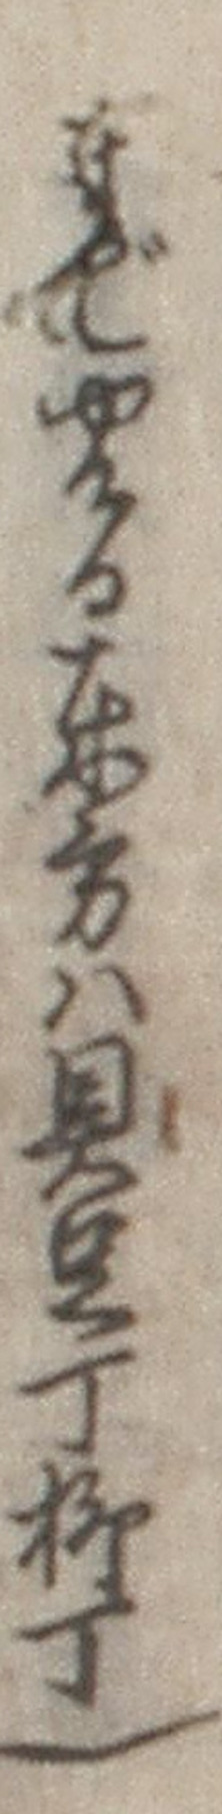までやける東方は具足丁柳丁
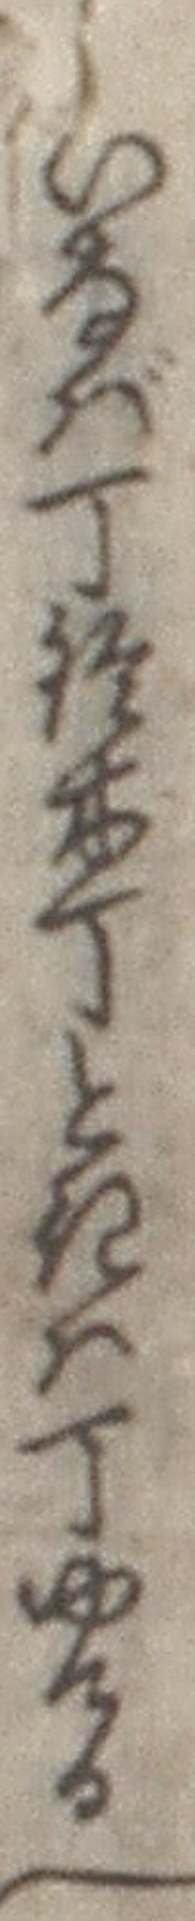いなば丁鐘木丁ときは丁やける
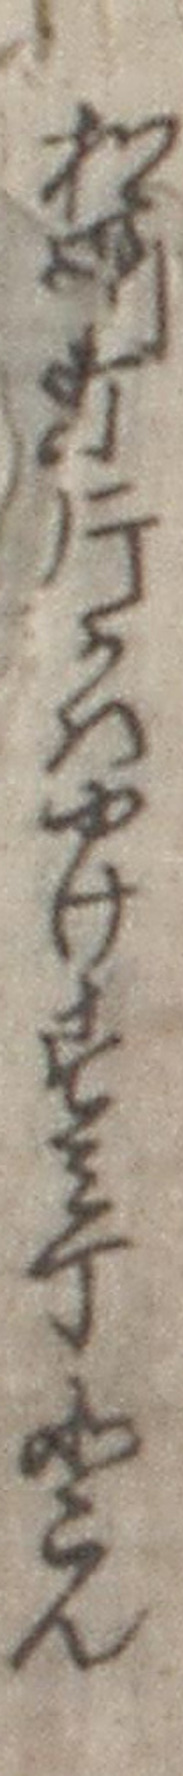松前丁片かはやけすミ丁北こん
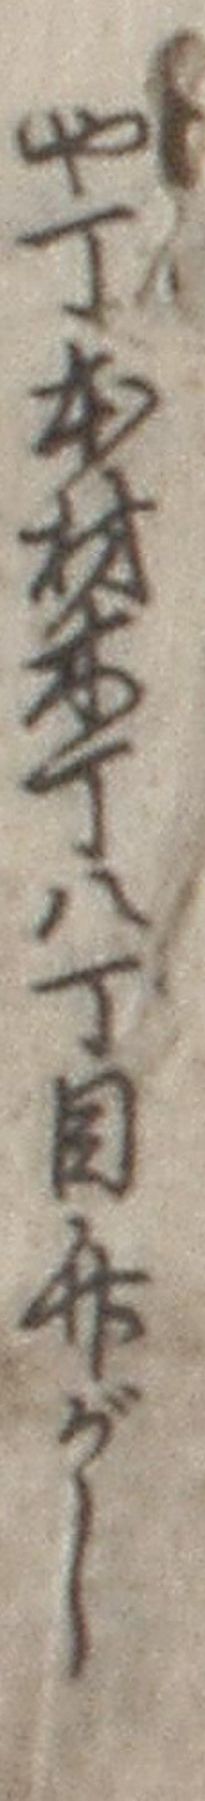や丁本材木丁八丁目竹がし
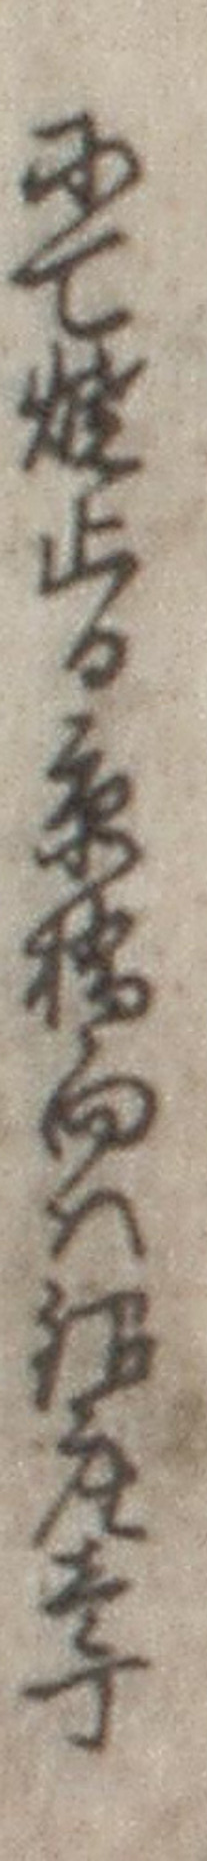にて焼止る糸橋向ハ銀座壱丁
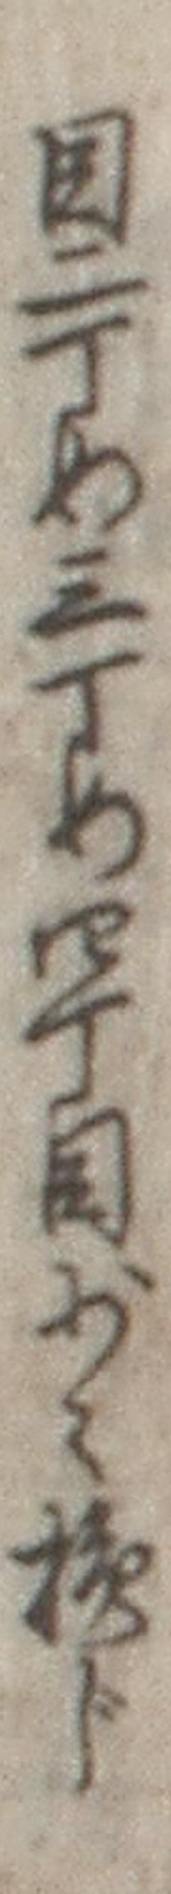目弐丁め三丁め四丁目少〻損じ
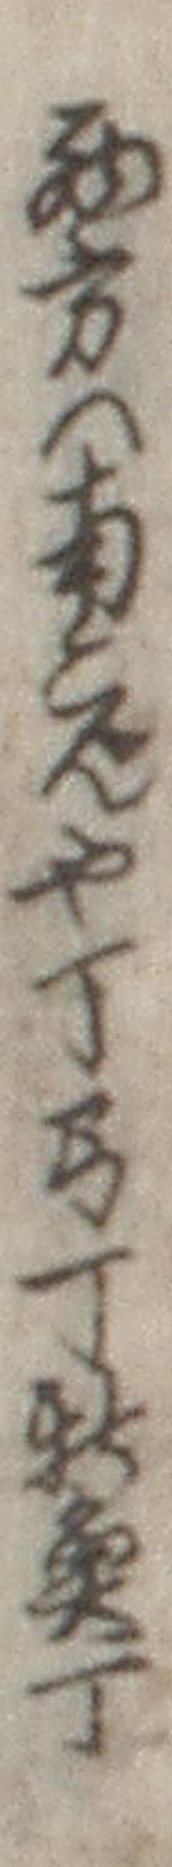西方へ南こんや丁弓丁新魚丁
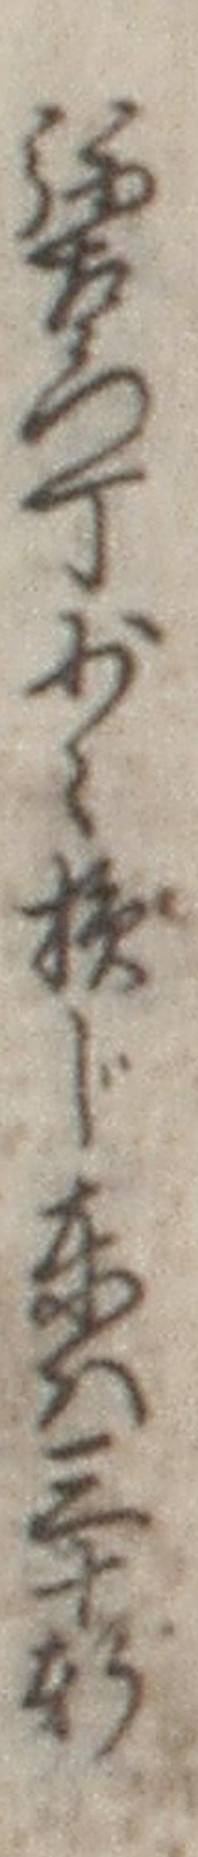弥左衛門丁少〻損じ東は三十軒
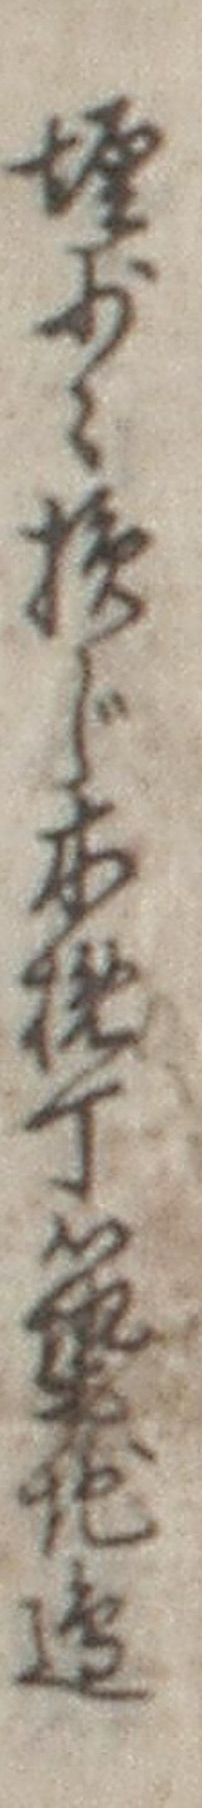堀少〻損じ木挽丁築地邊
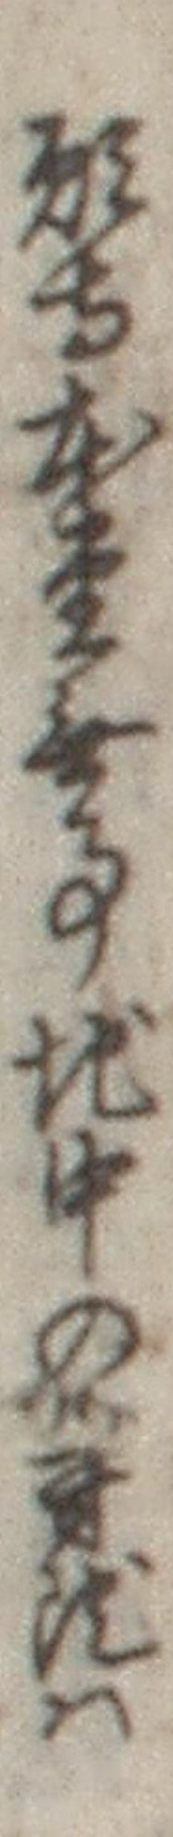願寺本堂無事地中の身陀は
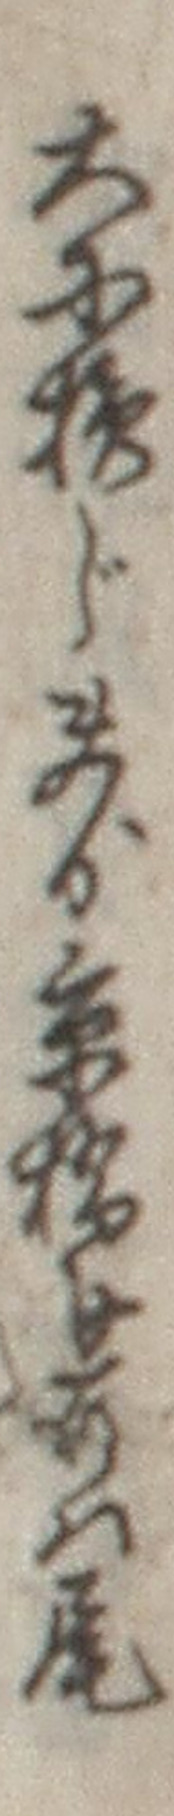大に損じ夫ゟ京橋通りは尾
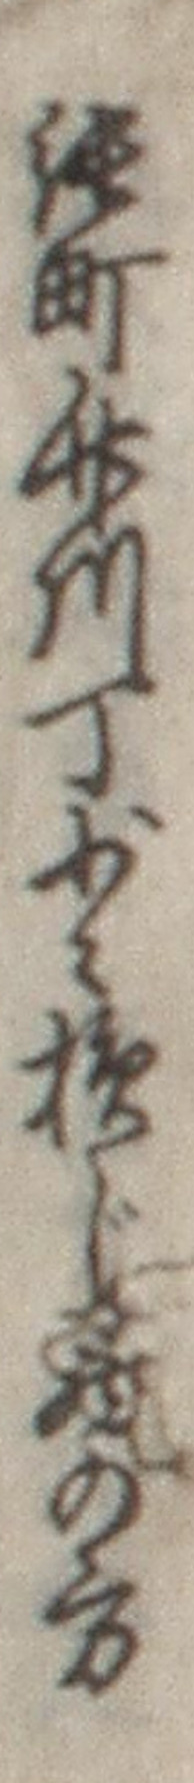張丁竹川丁少〻損じ西の方
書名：江戸　大地震臣細録　全
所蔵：東京大学地震研究所図書室 Earthquake Research Institute Library, The University of Tokyo, JAPAN
